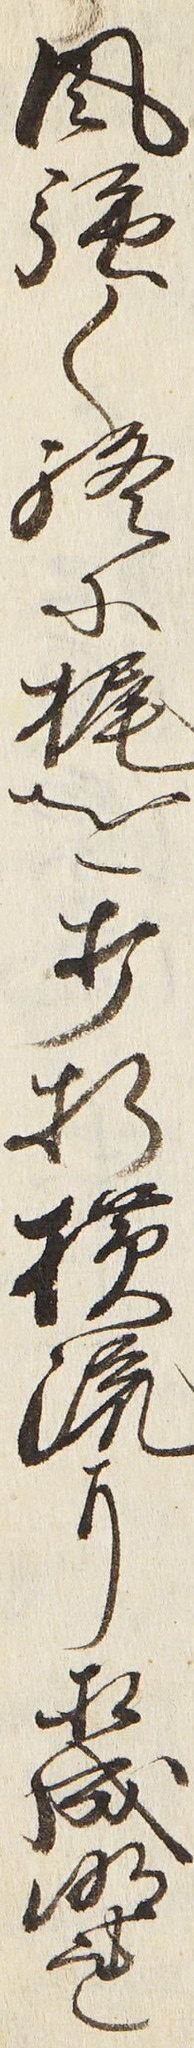風強く終に梶を打折横流に相成明れ
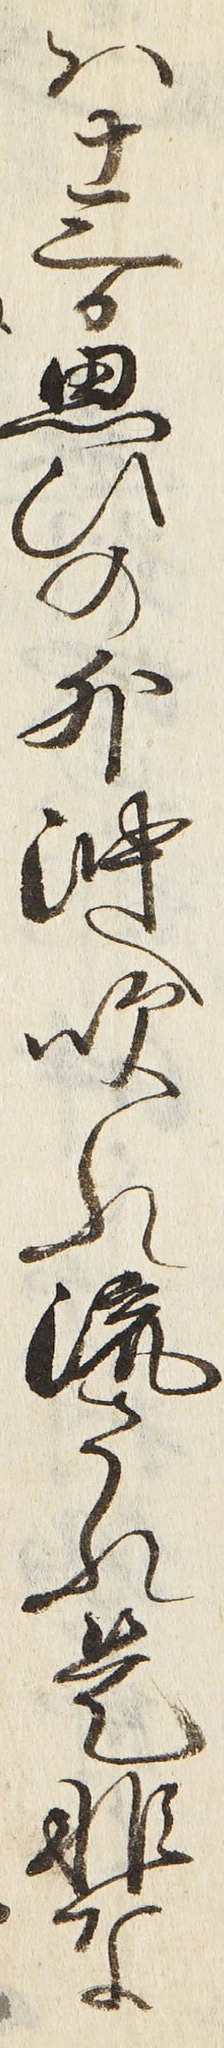は十三日想ひの外沖へ流され是非な
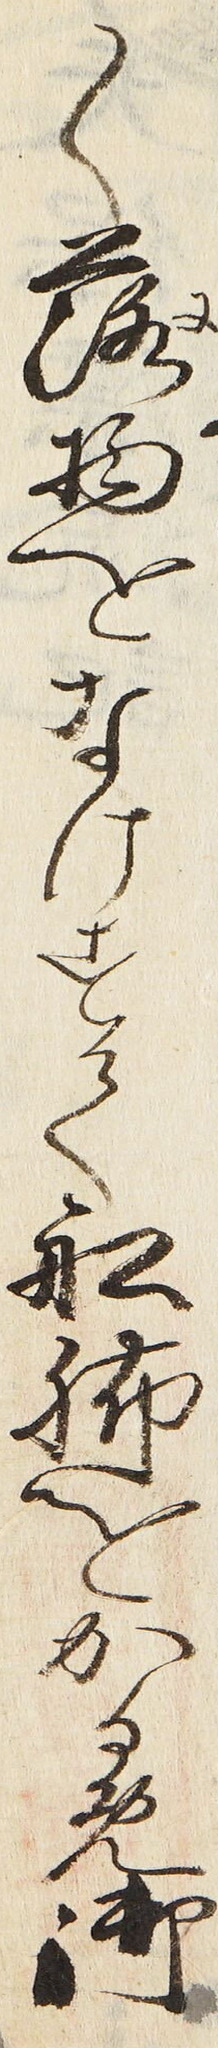く荷物をなけすて船脚をかるめ御
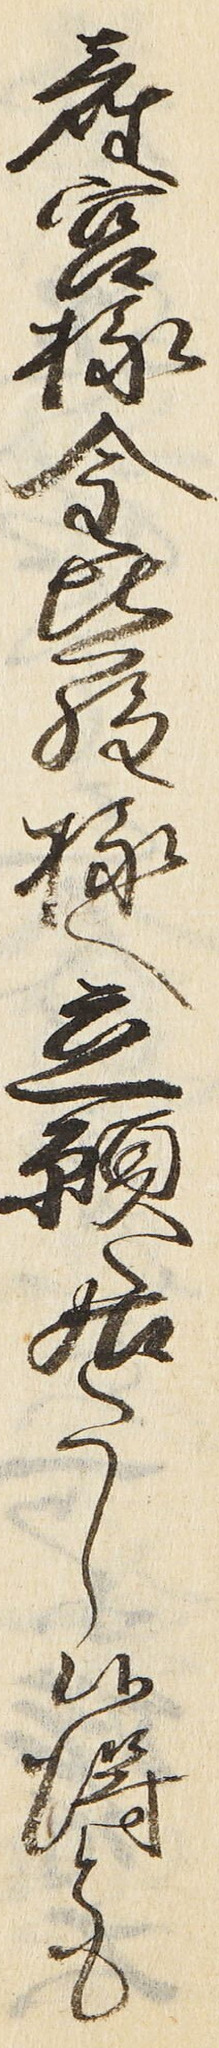産宮様金毘羅様へ立願居たく候得とも
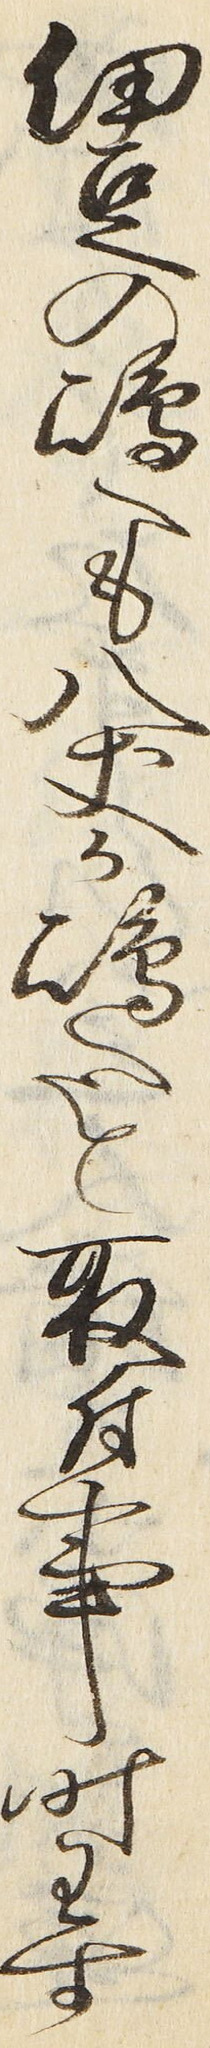伊豆の嶋へも八丈か嶋も取付事叶わす
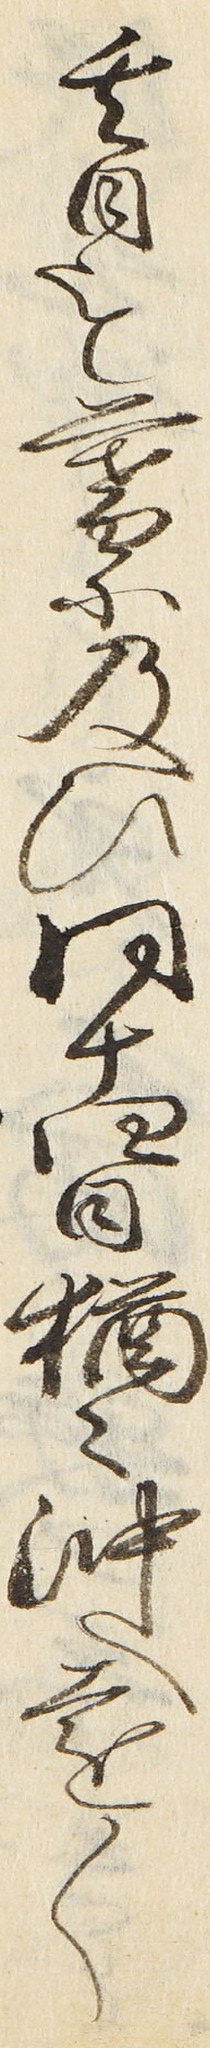其日も暮に及ひ同十四日猶々沖へ遠く
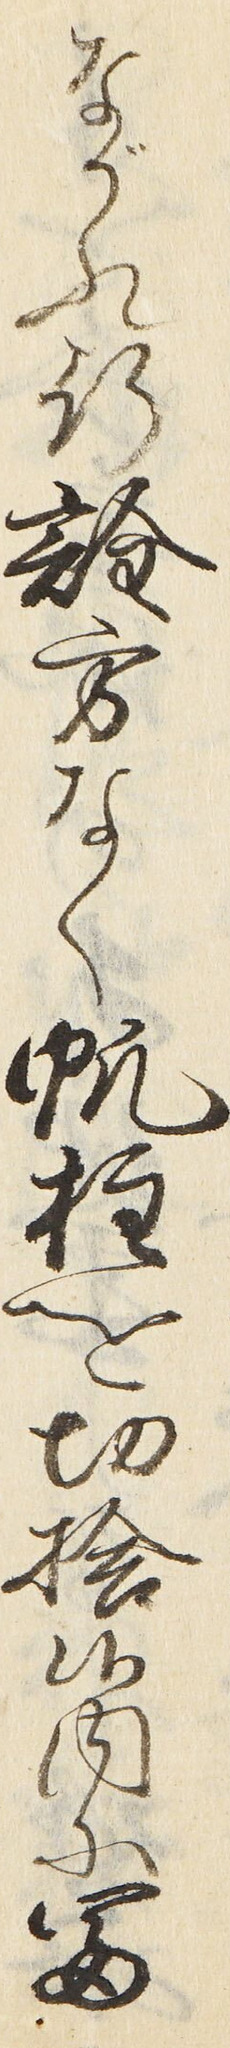ながれ行詮方なく帆柱を切捨候内に冨
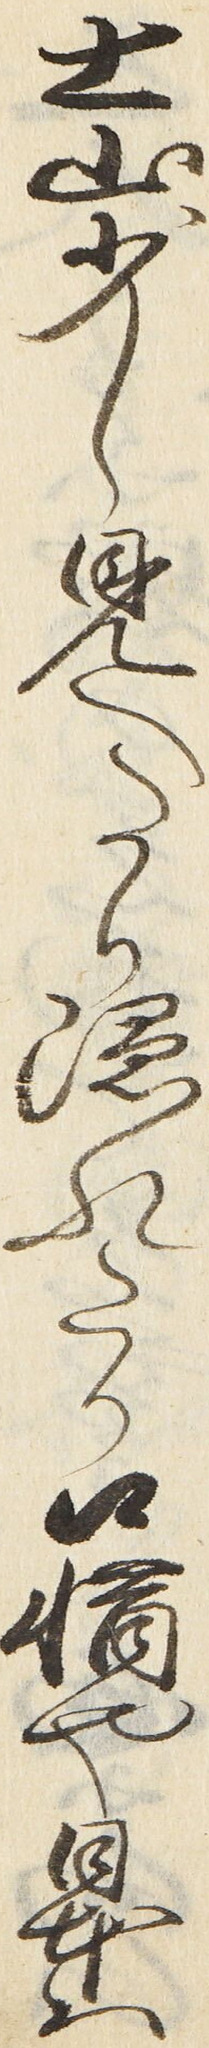士山少し見へたり隠れたり口惜や日本は
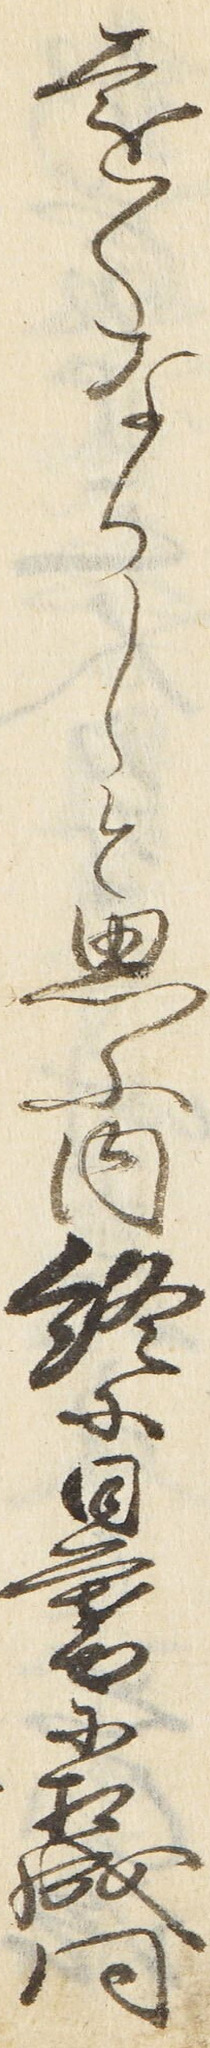遠くなりしと思ふ内終にひぐ日暮に相成同
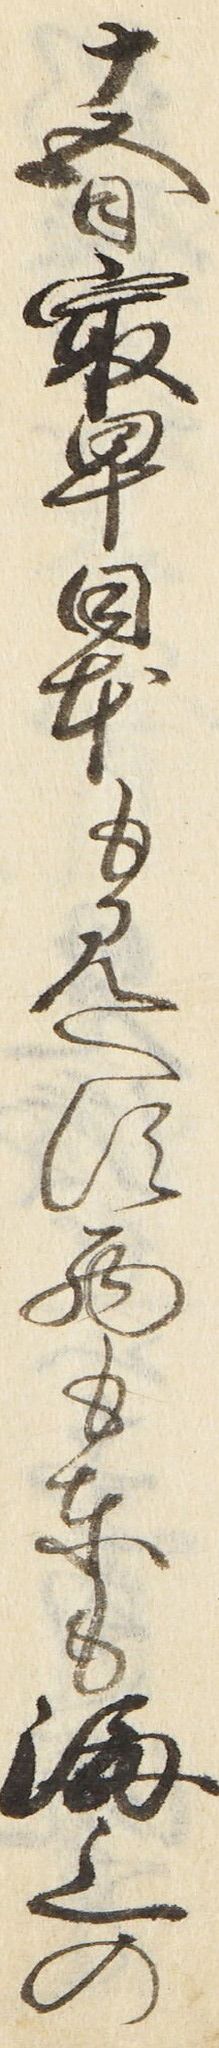十五日最早日本も見へす西も東も海上の
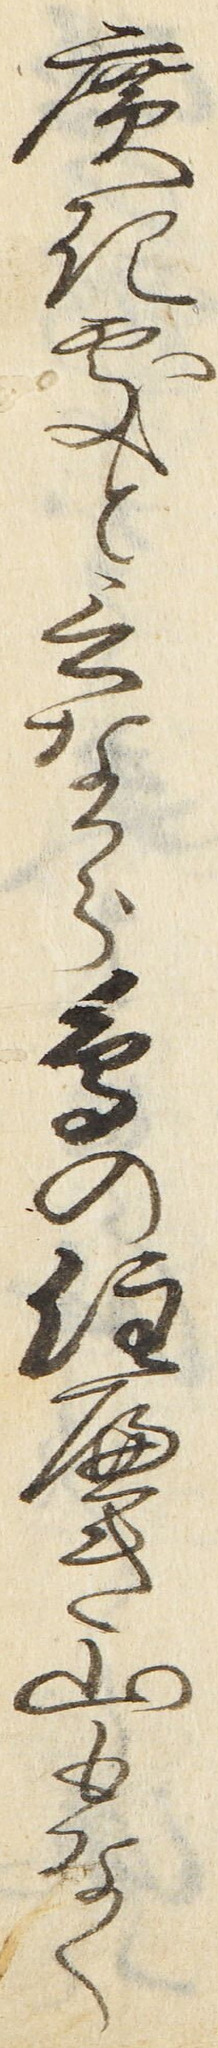広き處と云なから鳥の住むへき山もなく

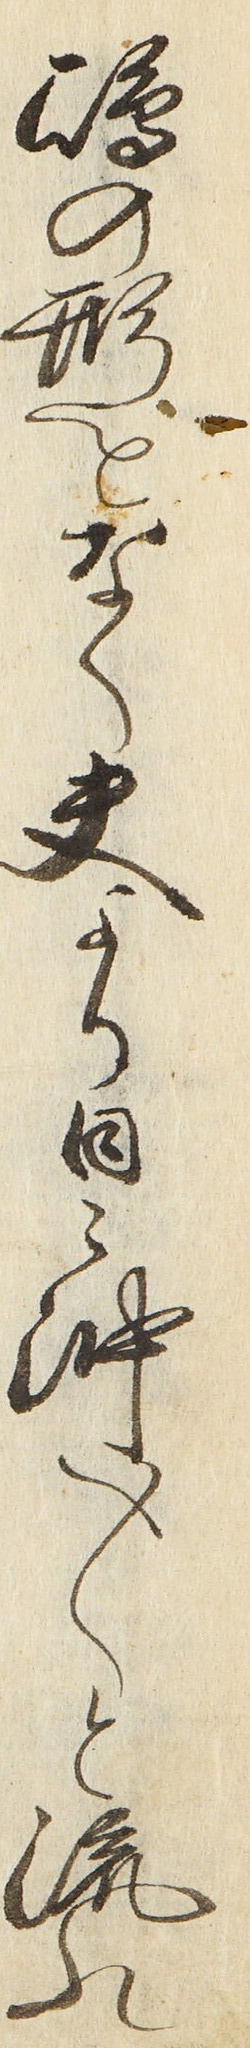嶋の形もなく夫より日々沖へ〳〵と流れ
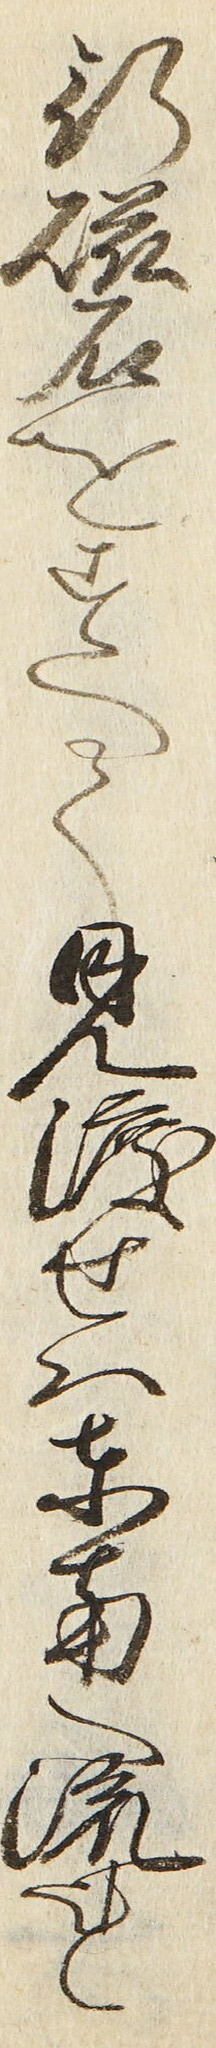行磁石をすへて見渡せは東南へ流れ
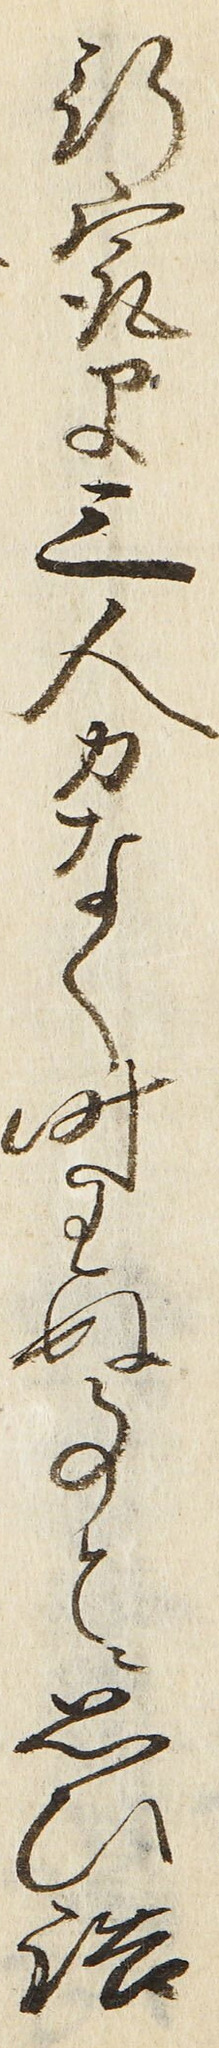行最早三人力なく叶わぬ事と思ひ詰
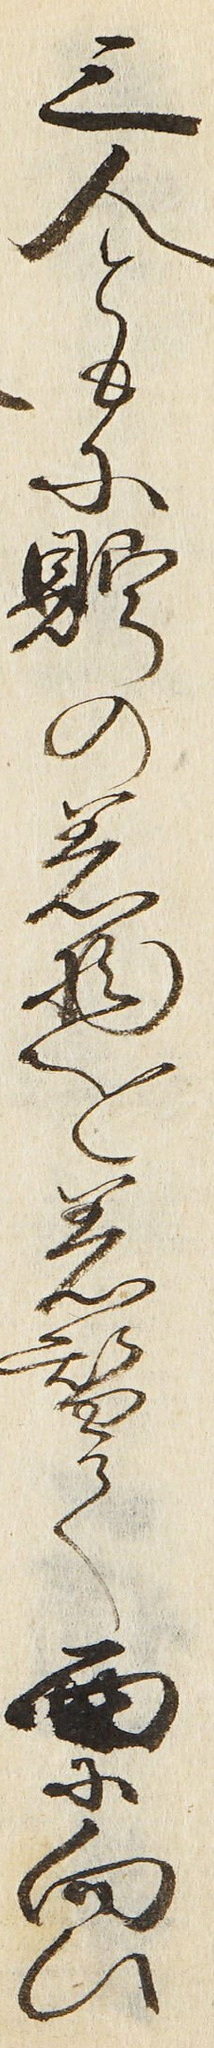三人ともに貯の着物を着替て西に向ひ
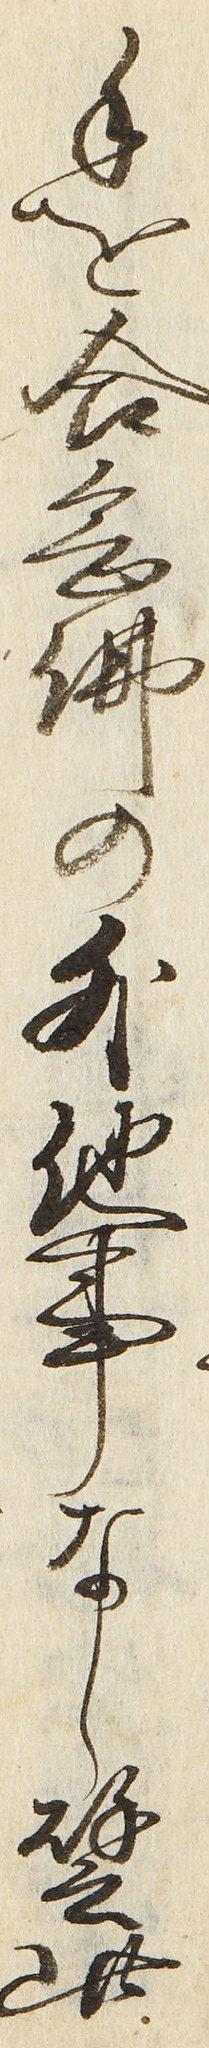手を合わ合念仏の外他事なし譬此
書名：天保漂流記
